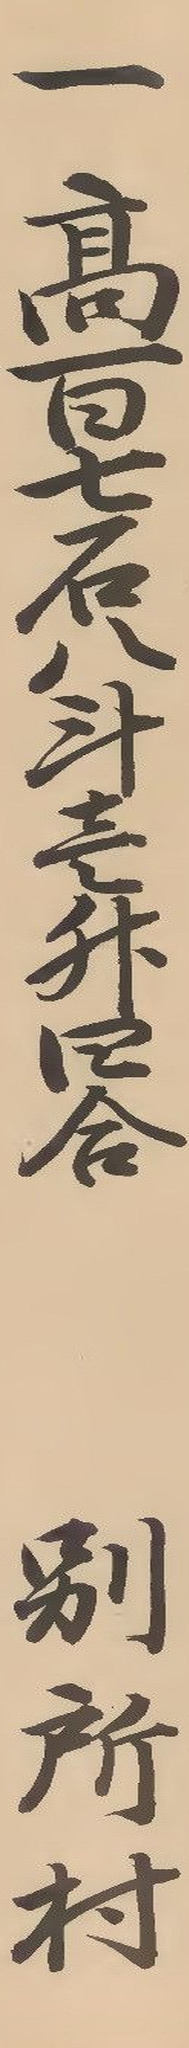一高百七石八斗壱升四合別所村
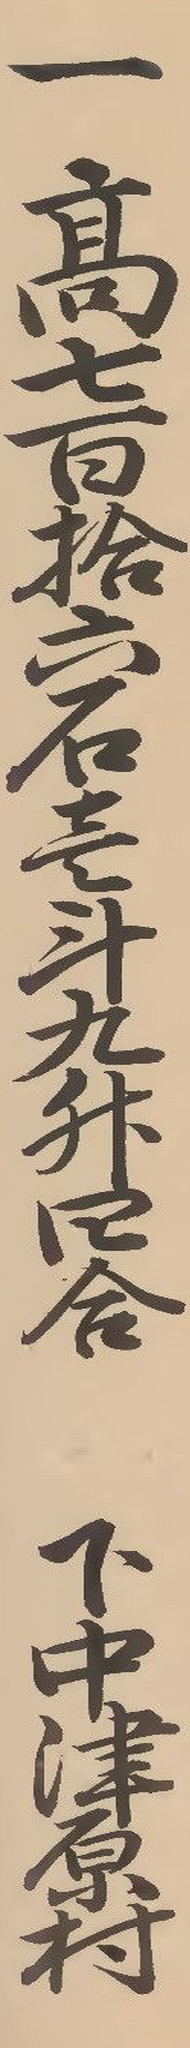一高七百拾六石壱斗九升四合下中津原村
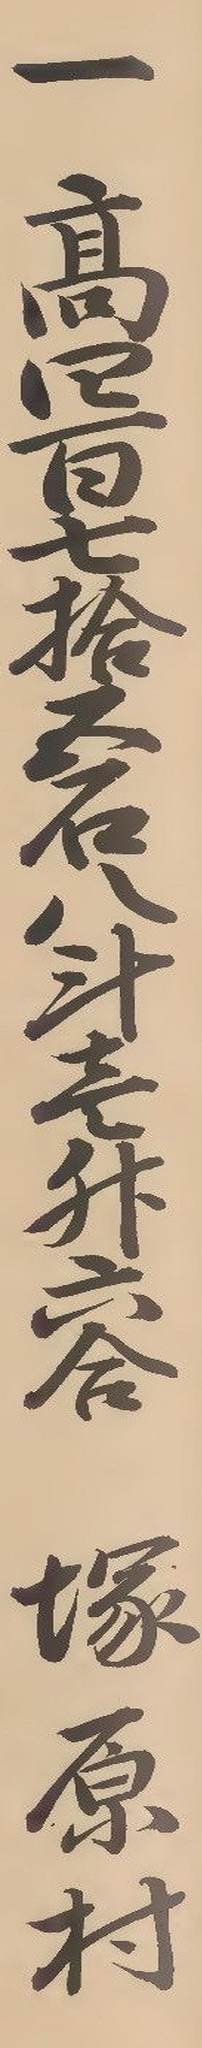一高四百七拾五石八斗壱升六合塚原村
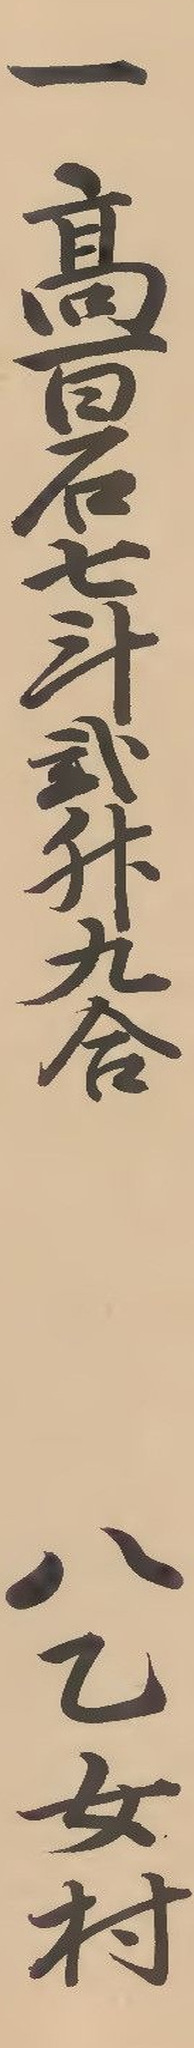一高百石七斗弐升九合八乙女村
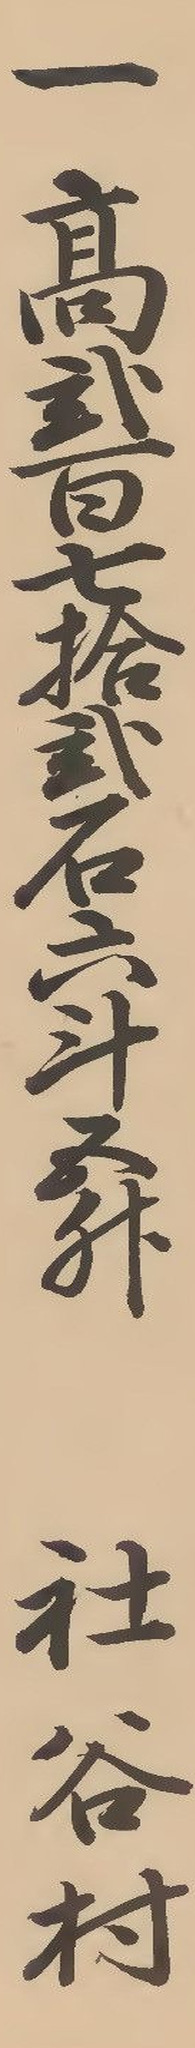一高弐百七拾弐石六斗五升社谷村
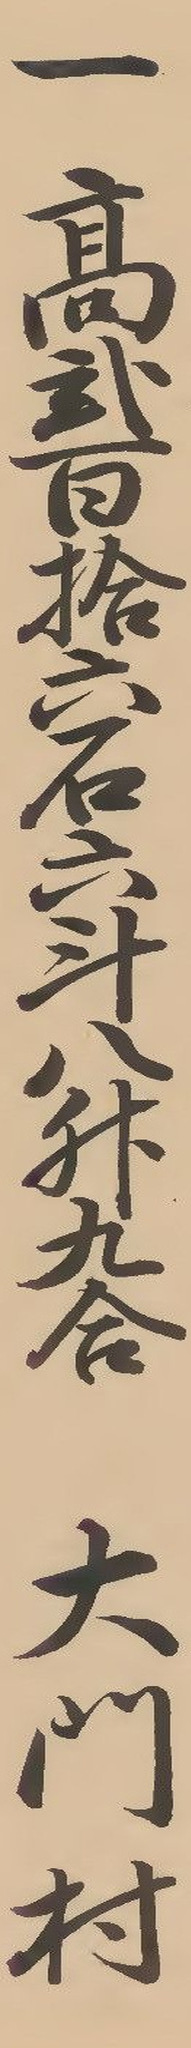一高弐百拾六石六斗八升九合大門村

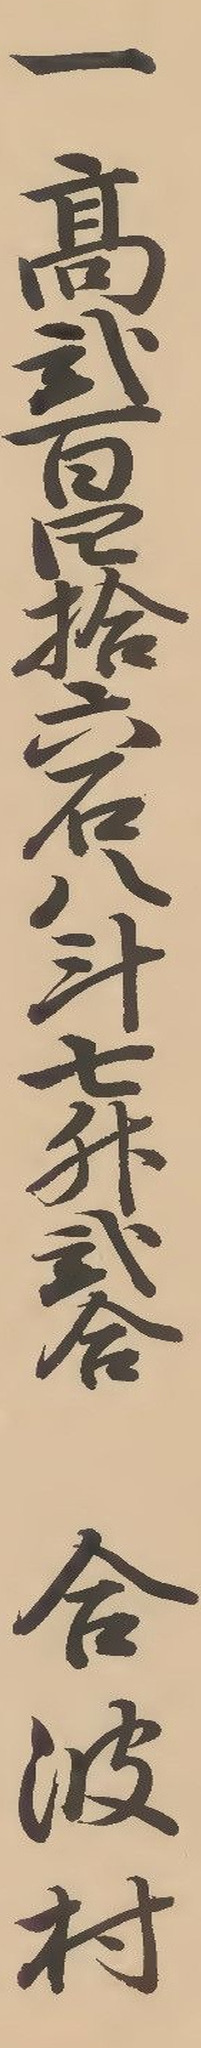一高弐百四拾六石八斗七升弐合合波村
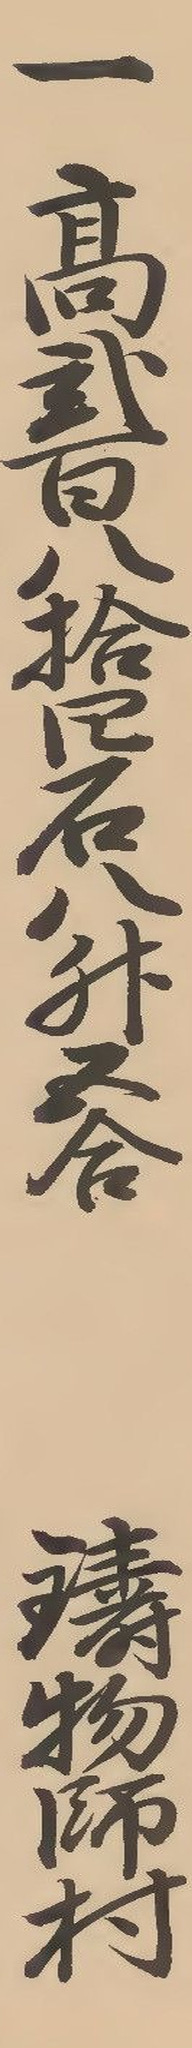一高弐百八拾四石八升五合鋳物師村
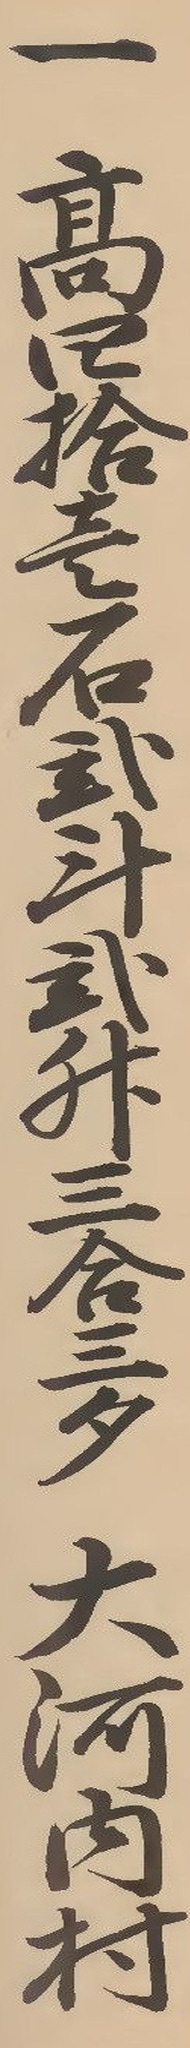一高四拾壱石弐斗弐升三合三勺大河内村
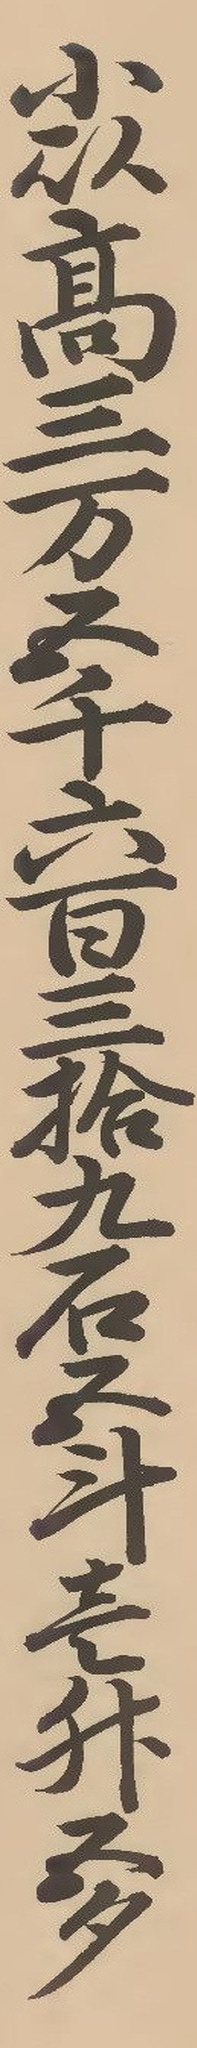小以高三万五千六百三拾九石五斗壱升五勺

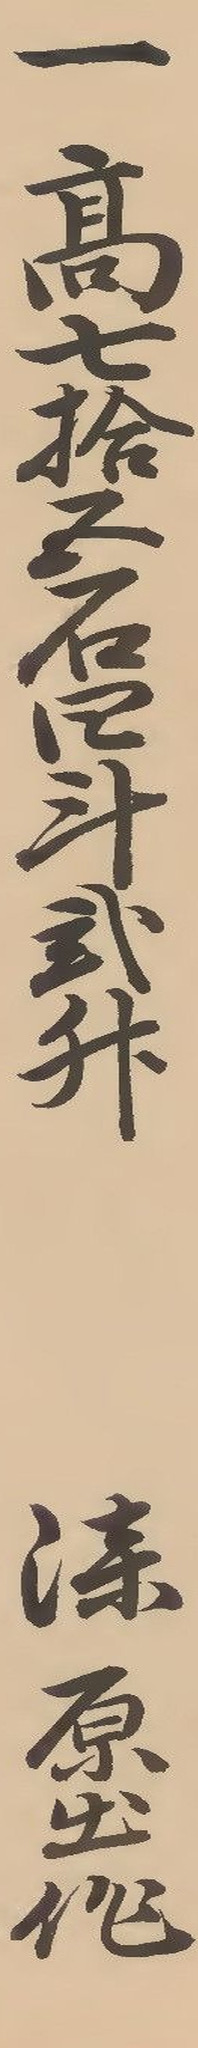一高七拾五石四斗弐升漆原出作
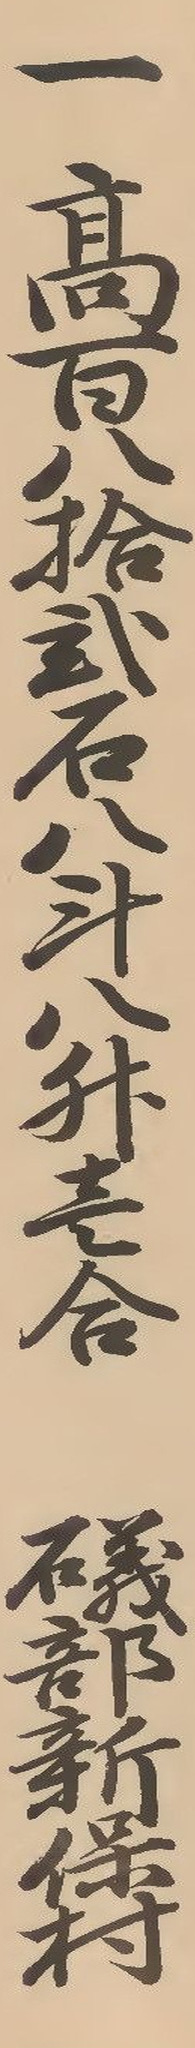一高百八拾弐石八斗八升壱合磯部新保村
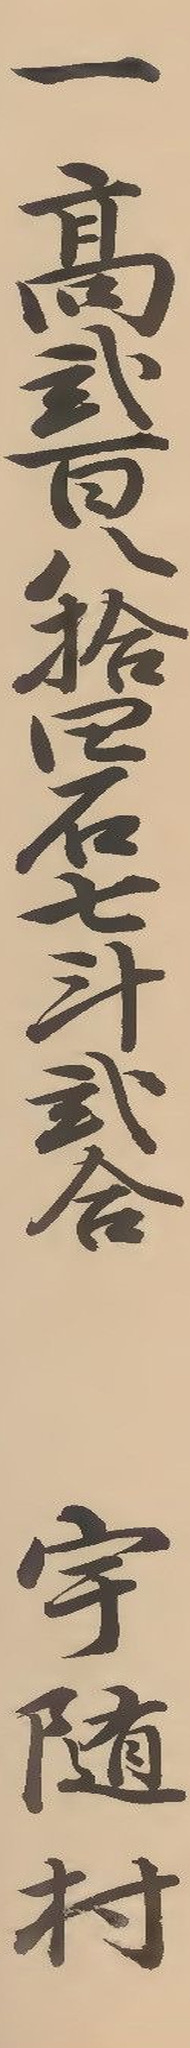一高弐百八拾四石七斗弐合宇随村
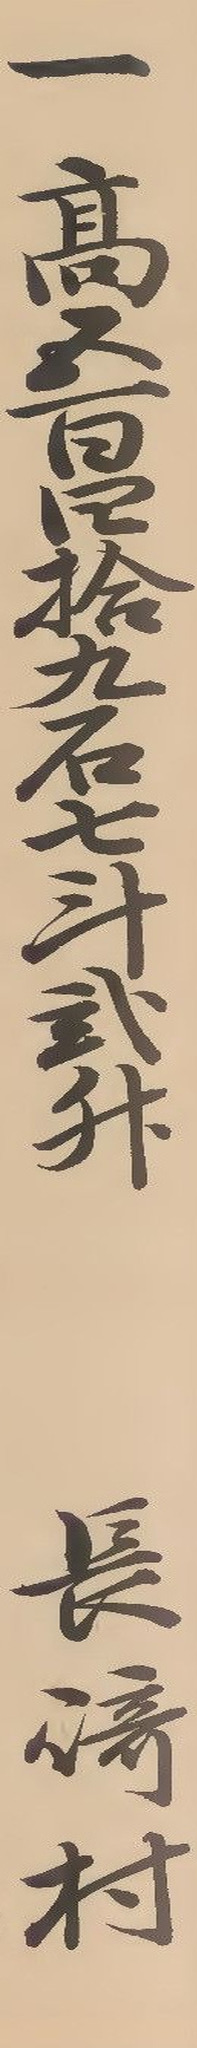一高五百四拾九石七斗弐升長崎村
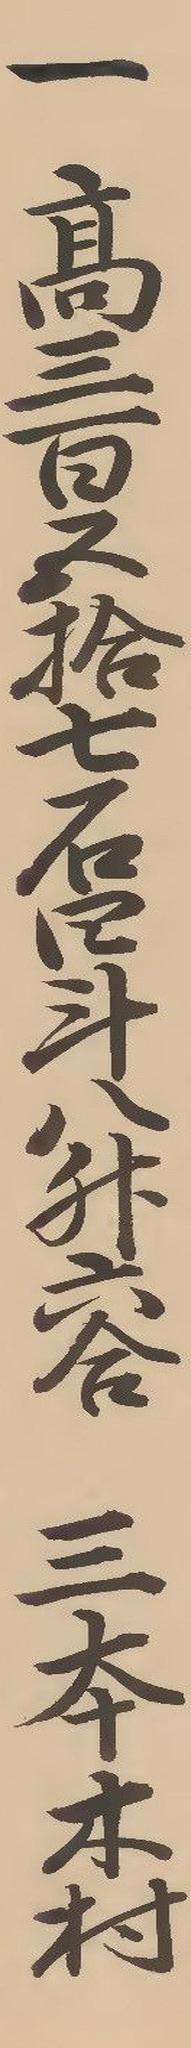一高三百五拾七石四斗八升六合三本木村

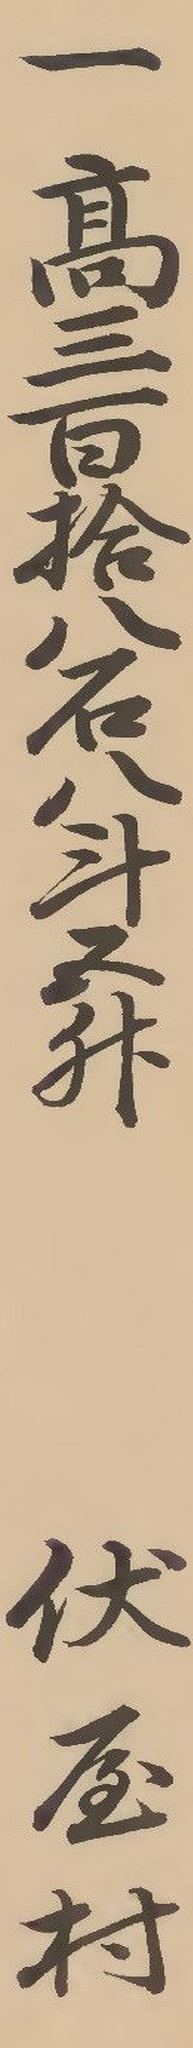一高三百拾八石八斗五升伏屋村
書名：越前国郷帳
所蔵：国立公文書館 National Archives of Japan
